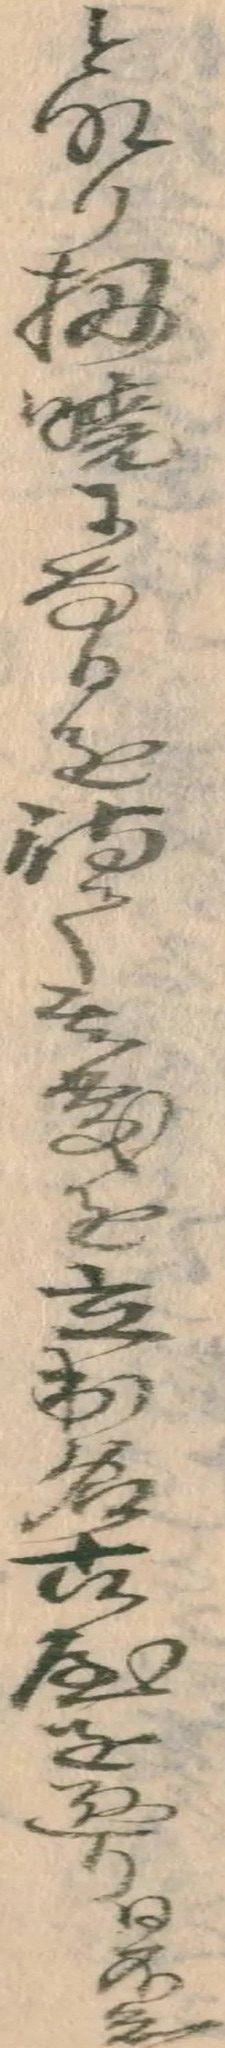となり扨暁になるを待て其処を立出名古屋を通り日名之
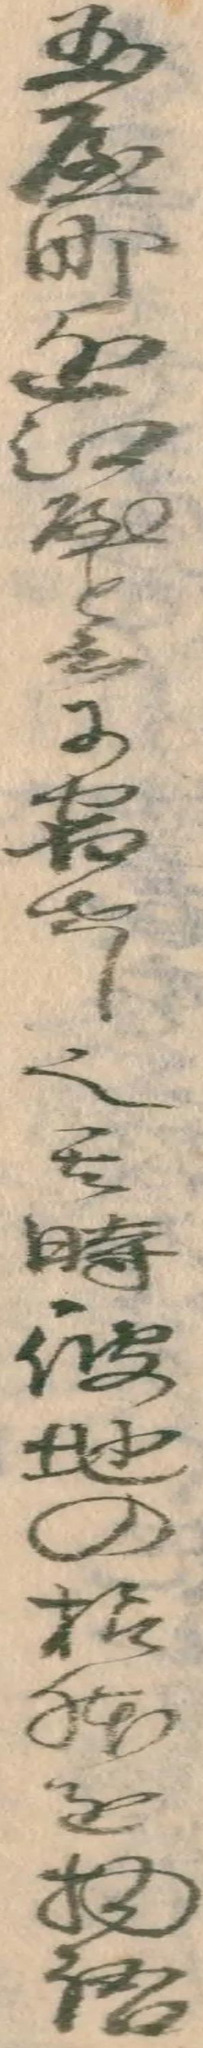玉屋町近江屋と云に宿せし也其時彼地の様体を物語
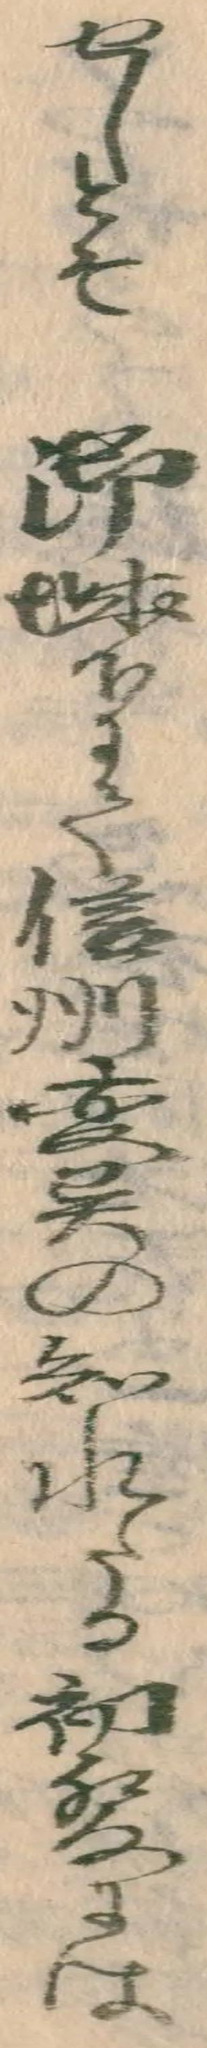せしとそ御城下にて信州変異の知れたる初発には
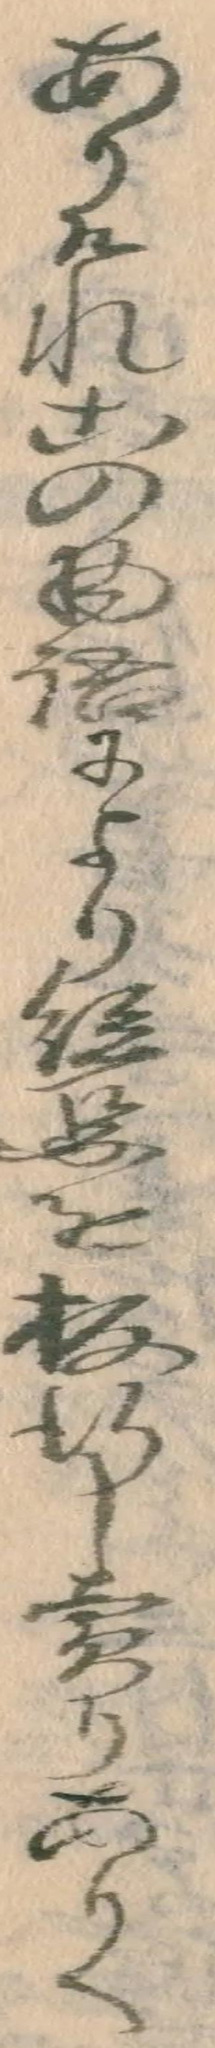ありけれこの物語により絵図を板行し売りありく
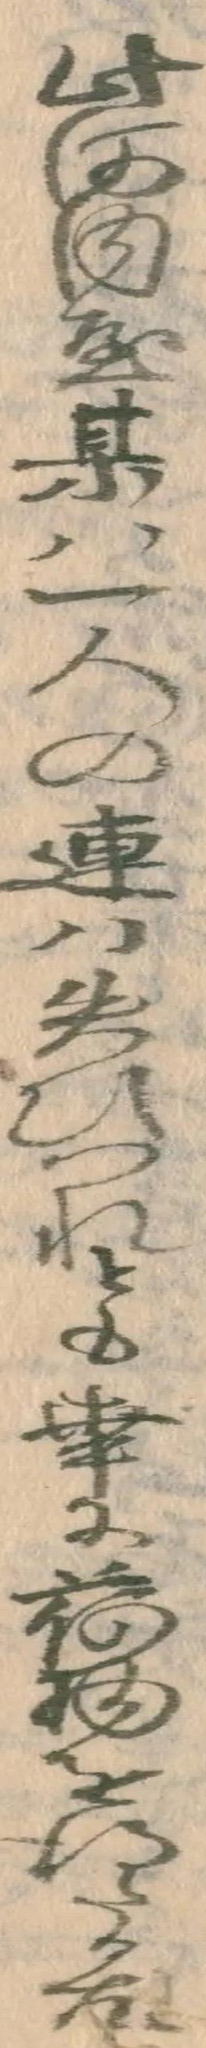此河内屋某ハ一人の連ハ失ひつれとも幸に荷物を得たる故
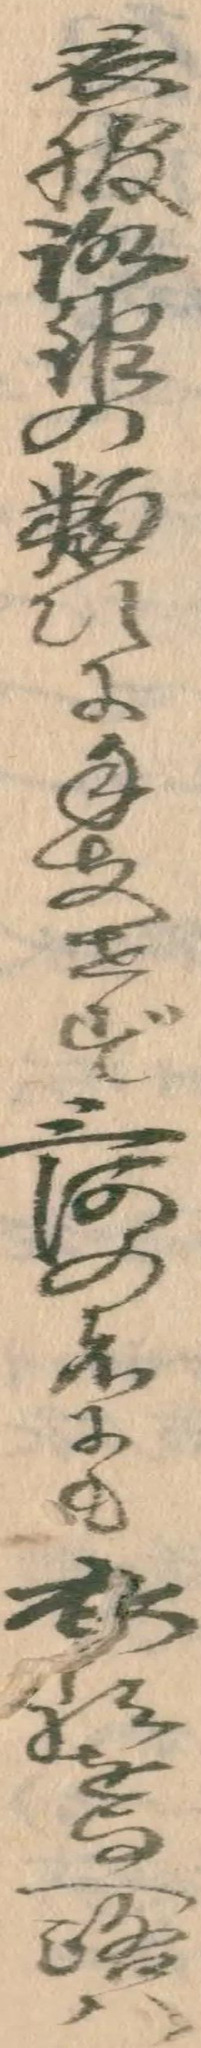衣服路銀の類ひに手支せず三河の者にも衣服を与へ路ハ
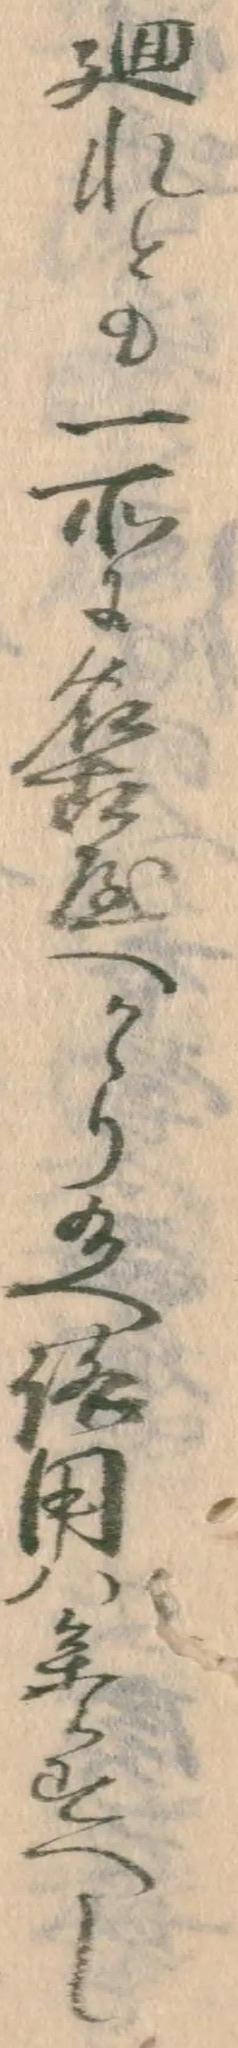廻れとも一所に名古屋へかゝり給へ路用ハ参りすへし
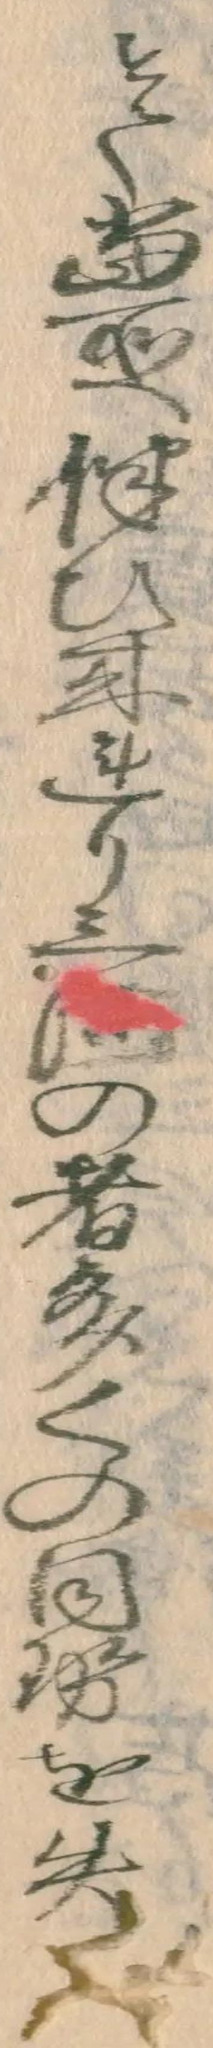とて当所へ悦ひ来れり三河の者多くの同勢を失
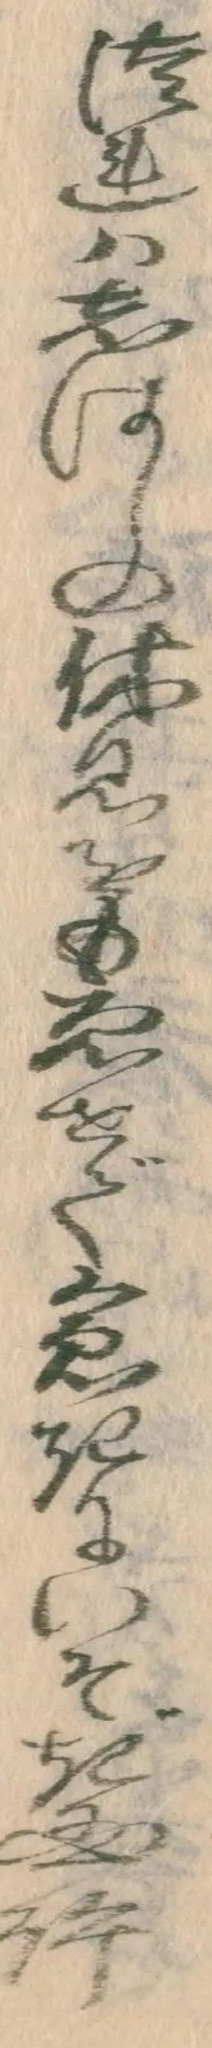けれハしはしの休息をも急せて急きにいそき国許
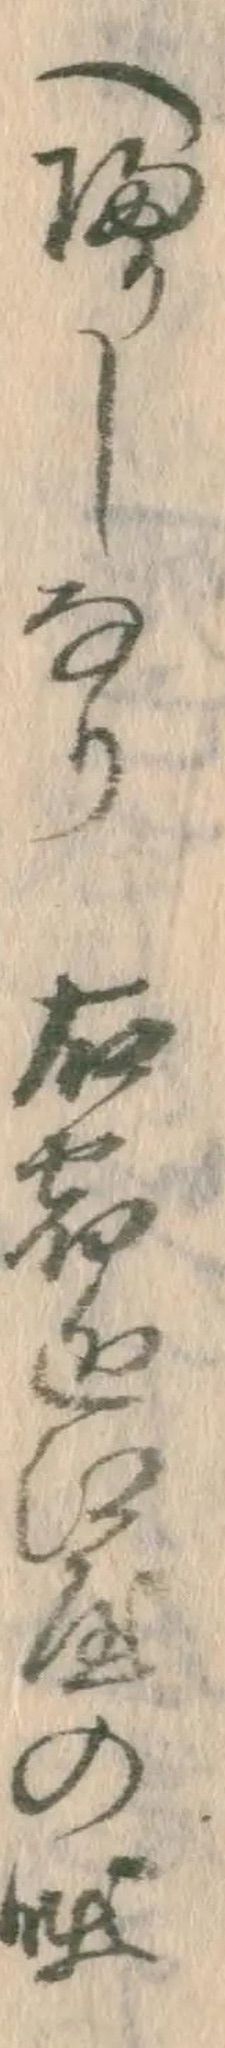へ帰りしなり右者近江屋の咄
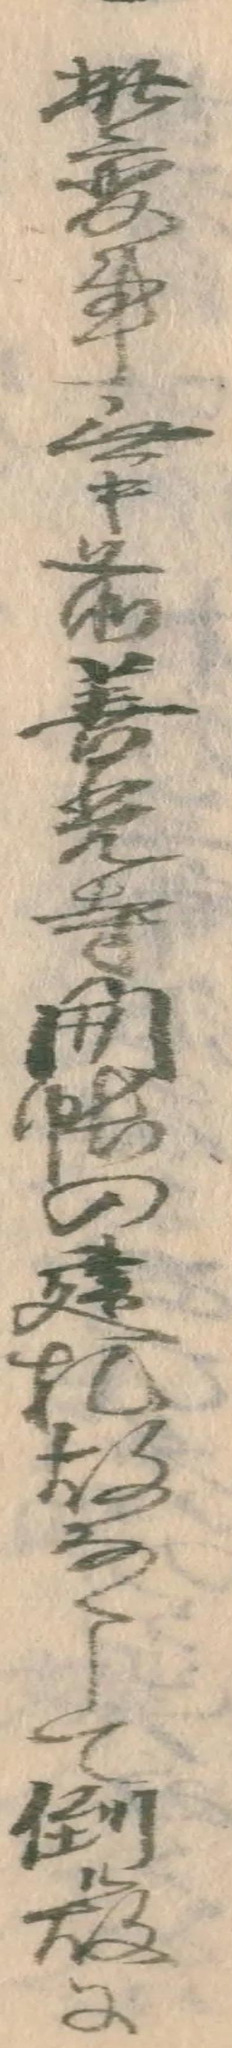此変事無キ前善光寺開帳のた建札故なくして倒ル故に
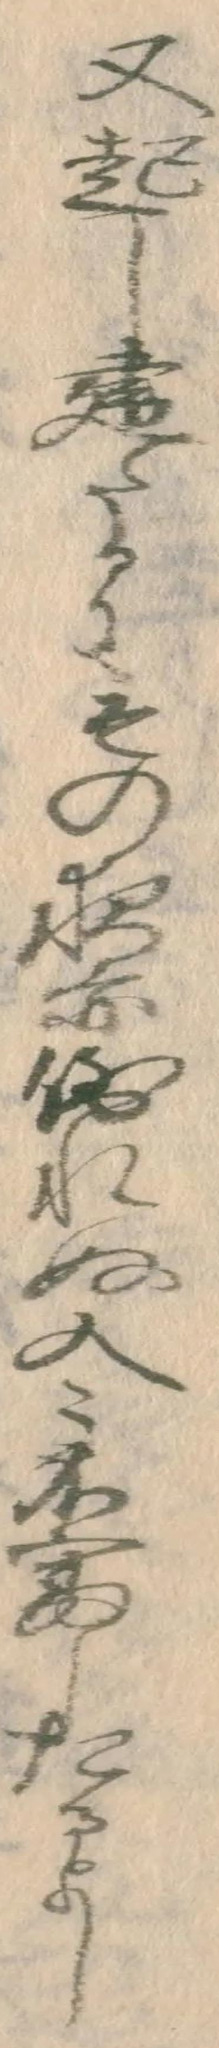又起し建たるにその夜亦倒れぬ人々不審したるよし
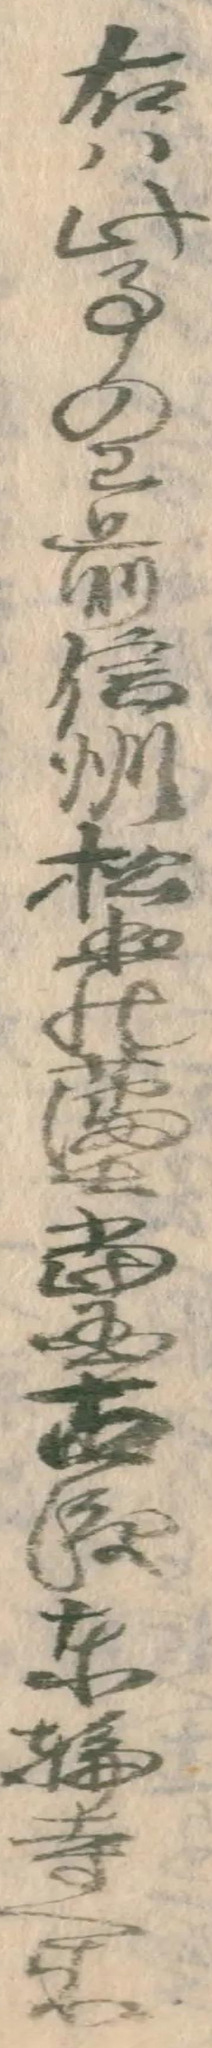右ハこ此事の已前信州松本の藩士当国古儀東輪寺へ来
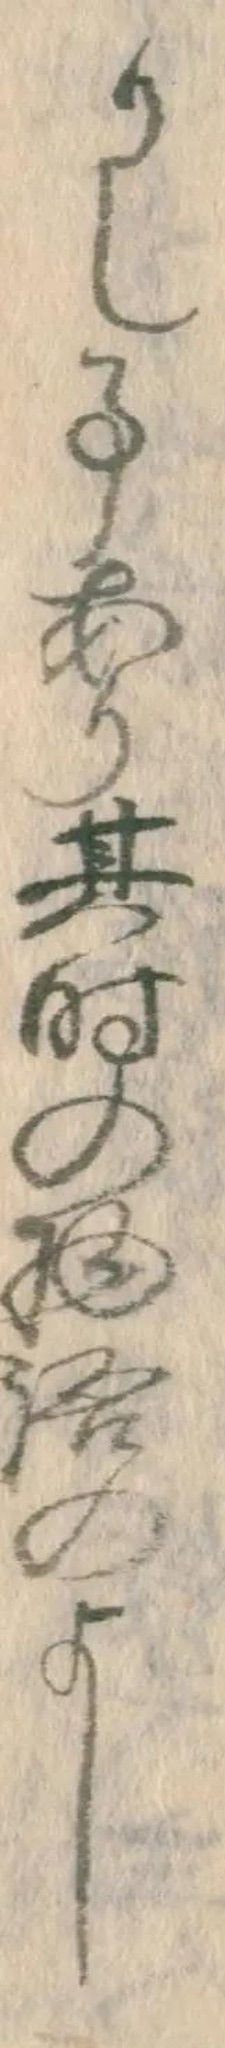りしことあり其時の物語のよし
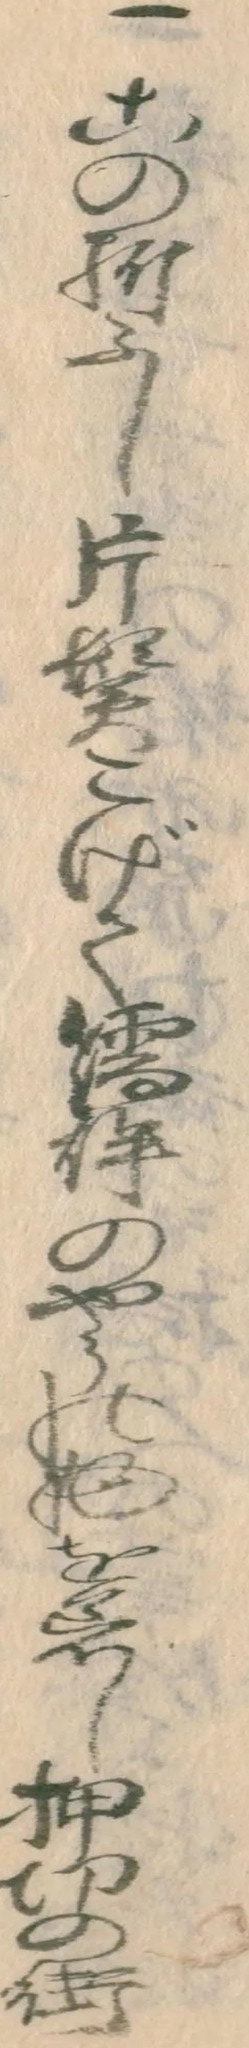一この折ふし片髪こげて襦袢のやらの物を着し押切の街
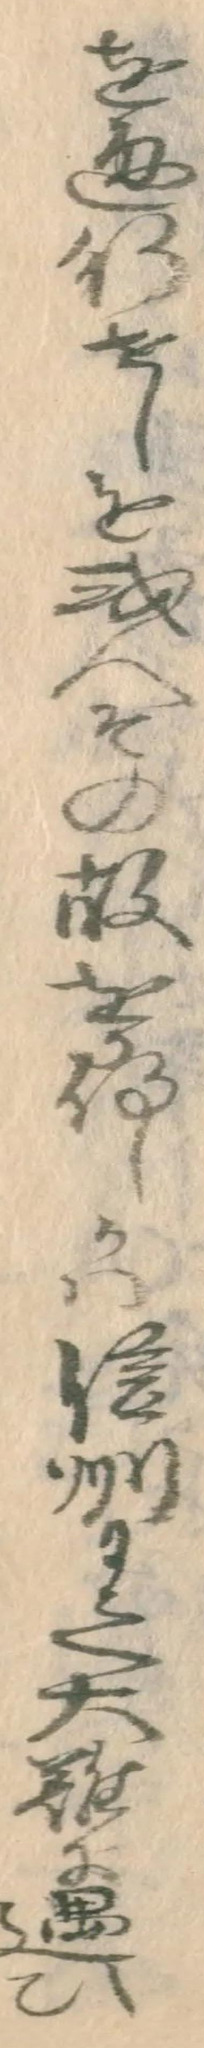を通行せしを或ハその故を尋しかハ信州にて大難に遭ひ
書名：信州大地震之記
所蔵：国立国会図書館 National Diet Library, JAPAN
